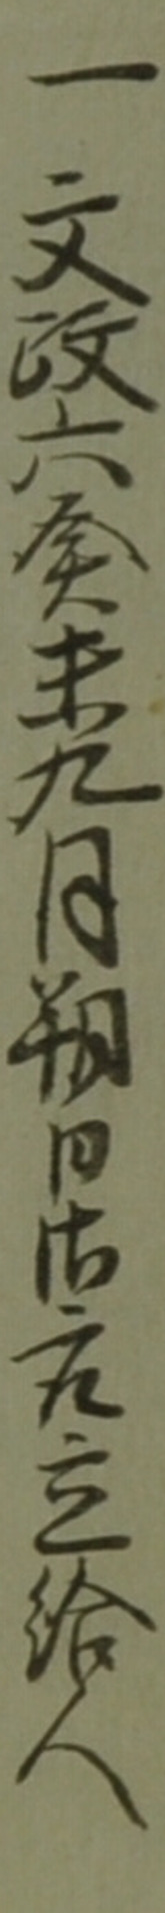一文政六癸未九月朔日御取立給人
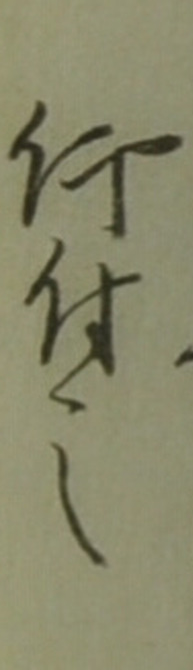仰付之
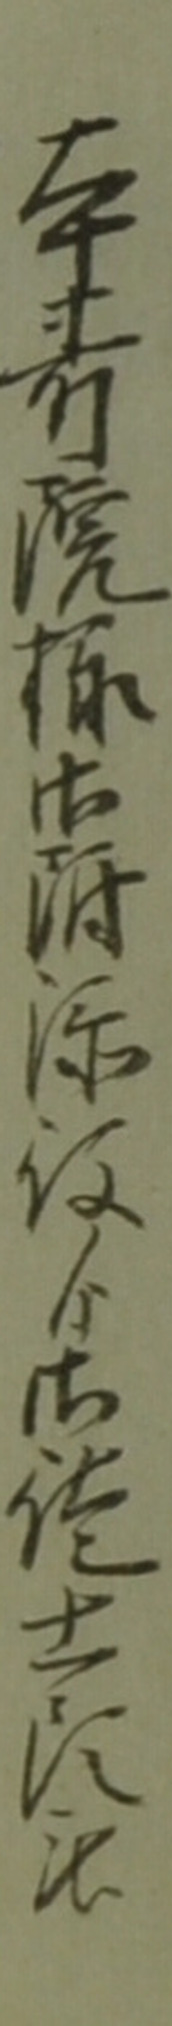本寿院様御附添役ゟ御徒士頭被

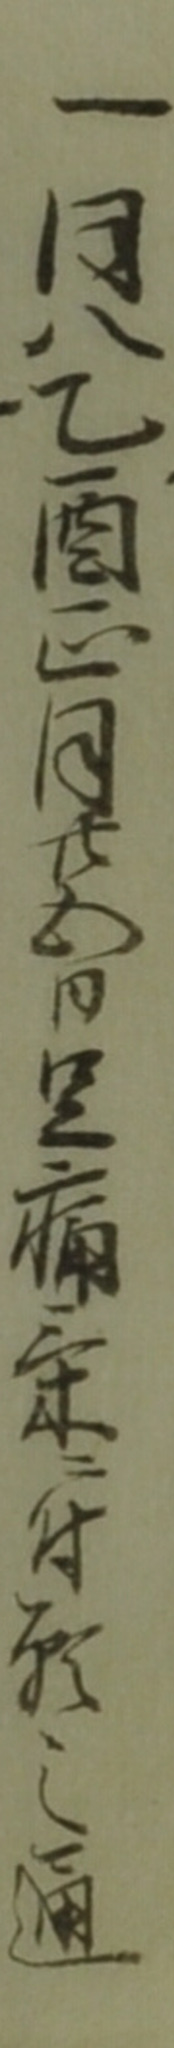一同八乙酉正月廿五日足病気ニ付願之通
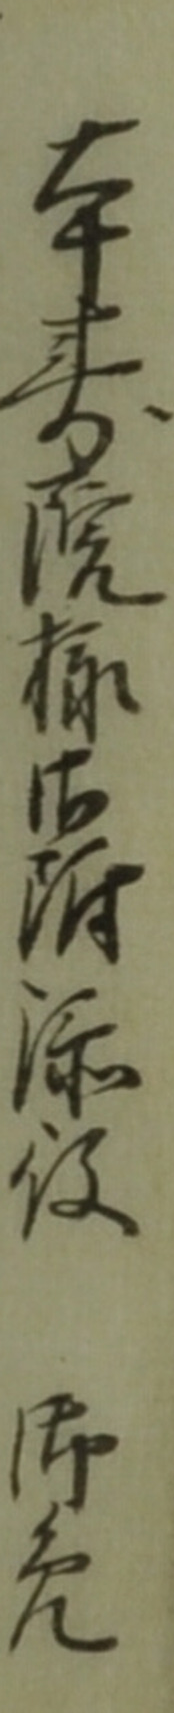本寿院様御附添役御免
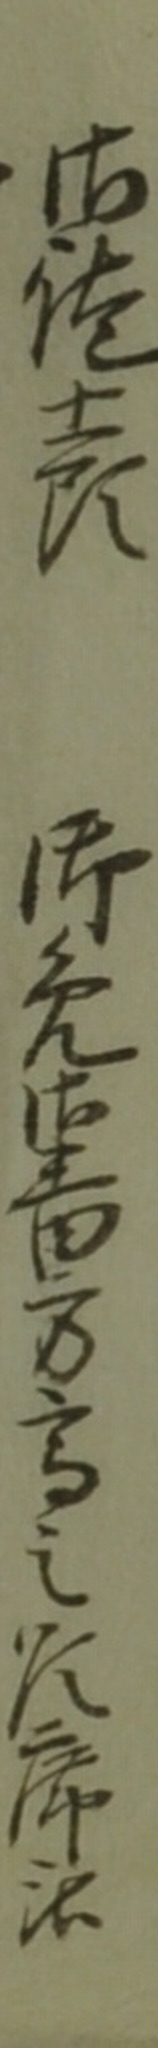御徒士頭御免御番方高之順席被
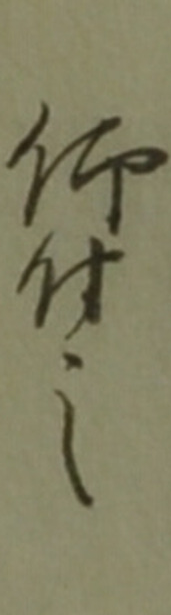仰付之
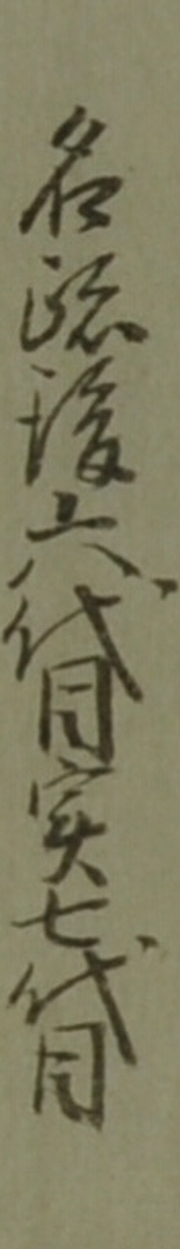名跡後六代目実七代目
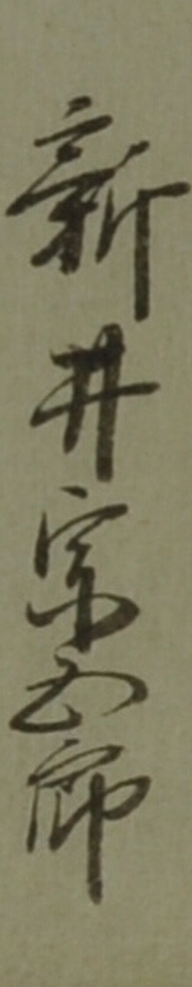新井宗五郎
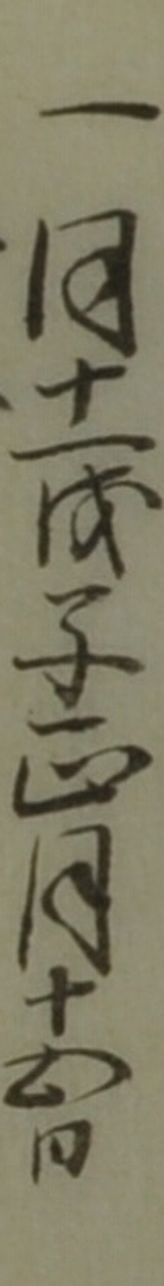一同十一戊子正月十五日
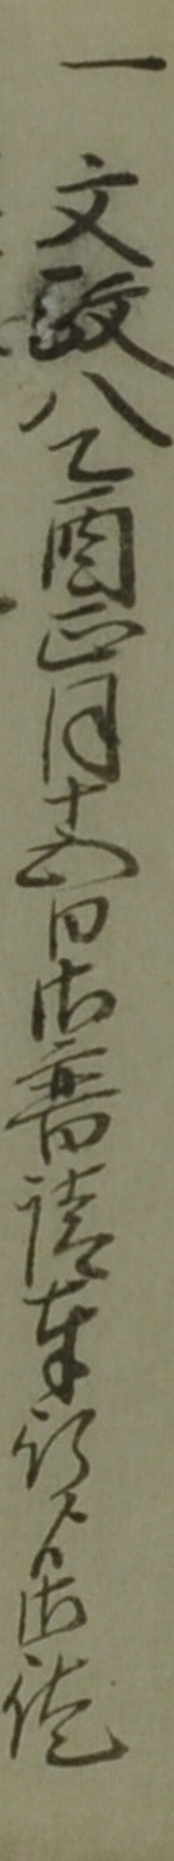一文政八乙酉正月十五日御普請奉行ゟ御徒
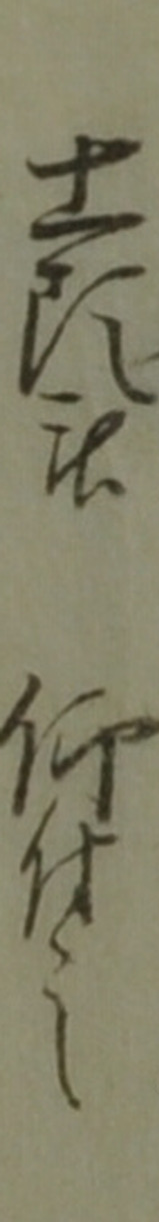士頭被仰付之
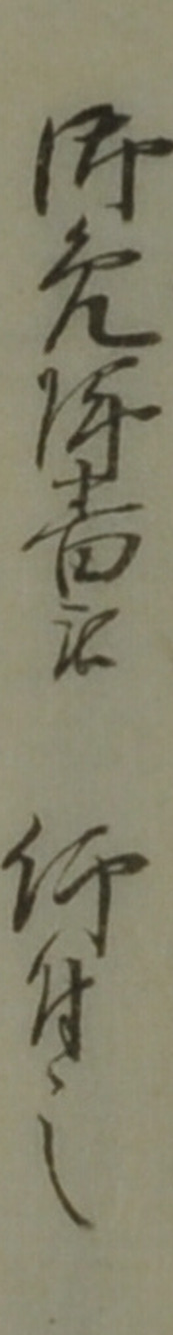御免帰番被仰付之
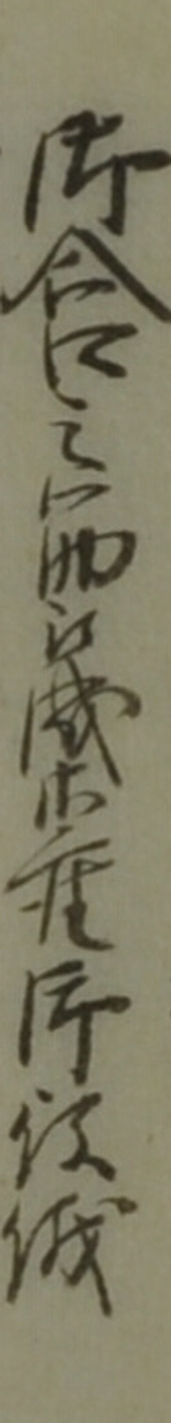御含之筋被成御座御役義
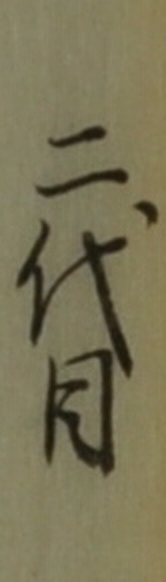二代目
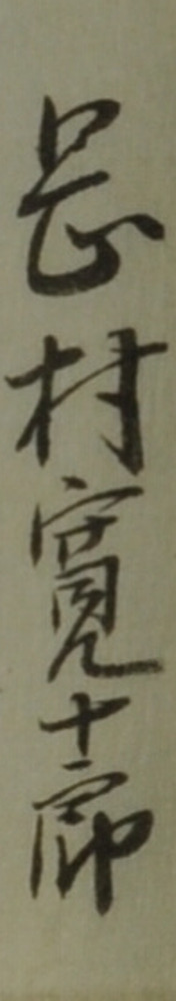岡村寛十郎
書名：諸御役代々録（六）
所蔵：伊那市立高遠町図書館・合同会社AMANE
